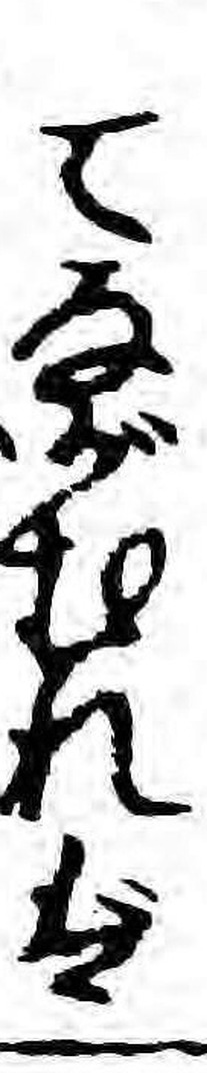てながむれば
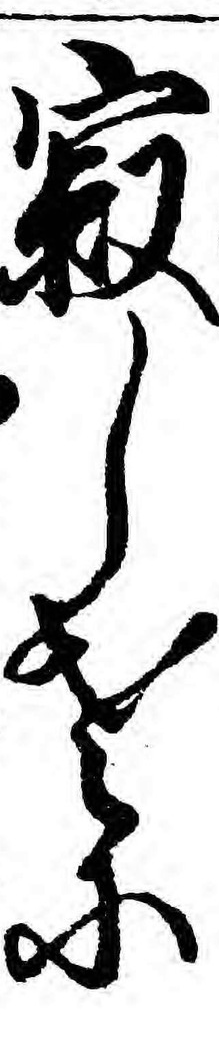寂しさに
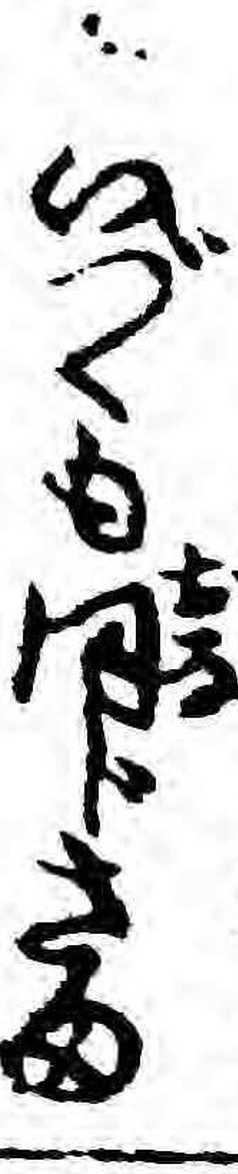いづくも同じさま
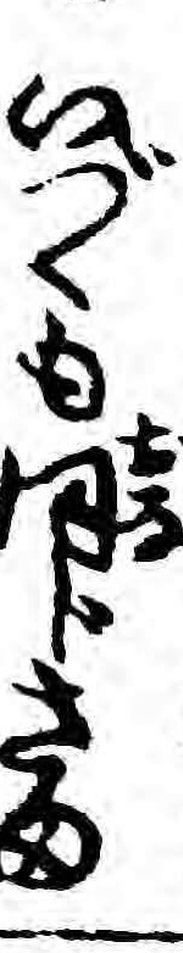いづくも同じさま
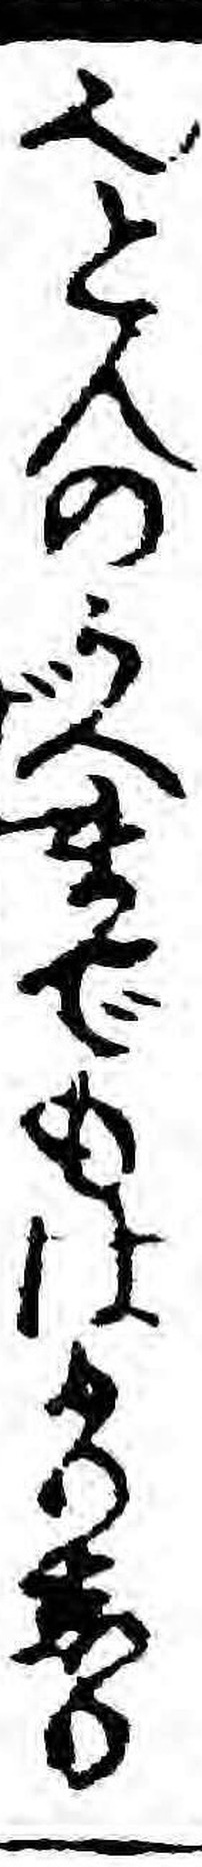也と人のうへまでもはかりしり
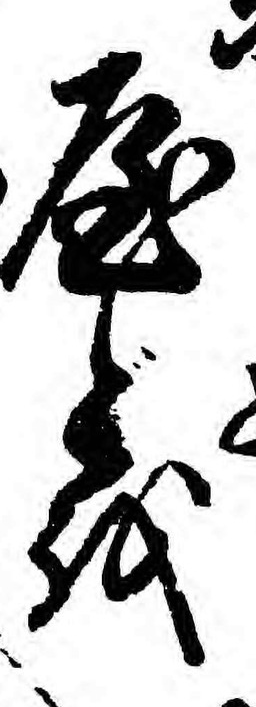やどを
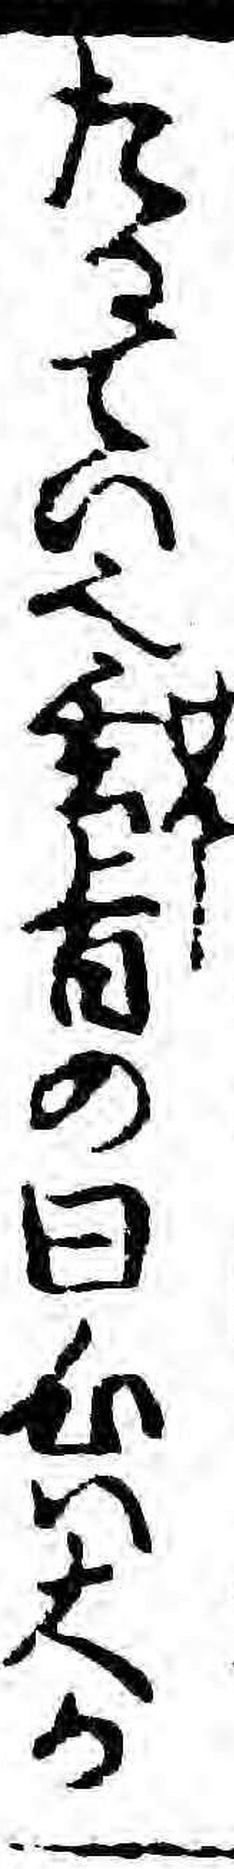たるてい也玄旨の曰心は大か
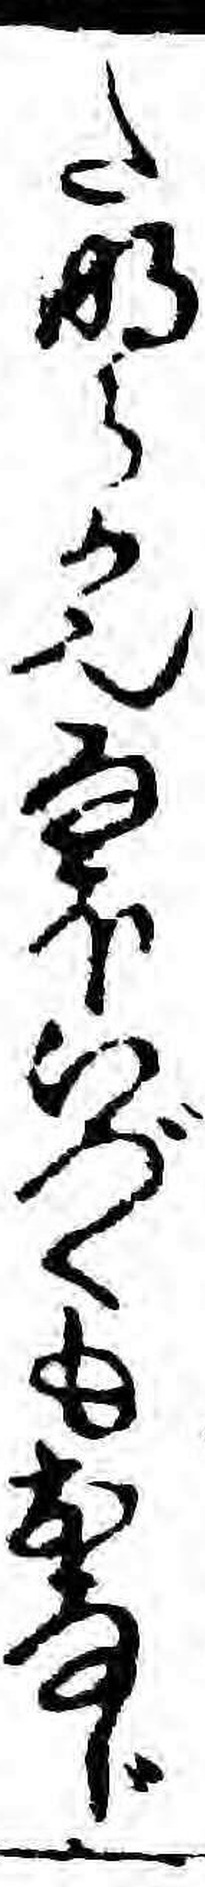た明らか也なほいづくもおなじ
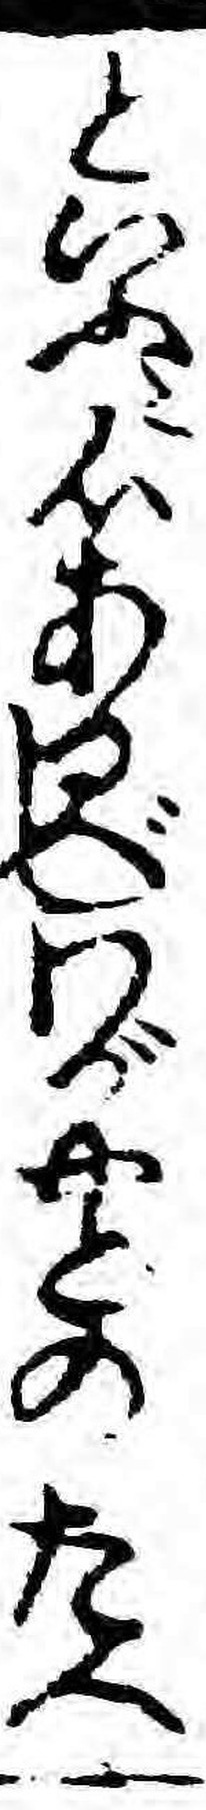といふに心あるべしわがやどのたへ
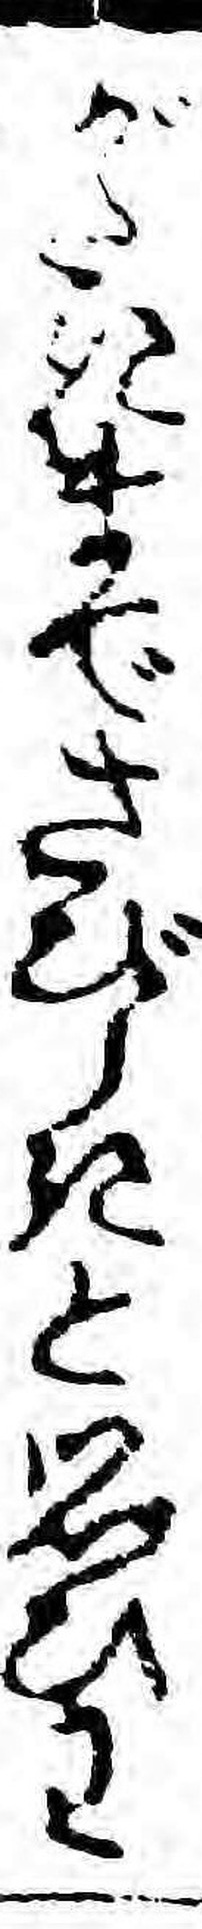がたきまでさびしきと思ひわ
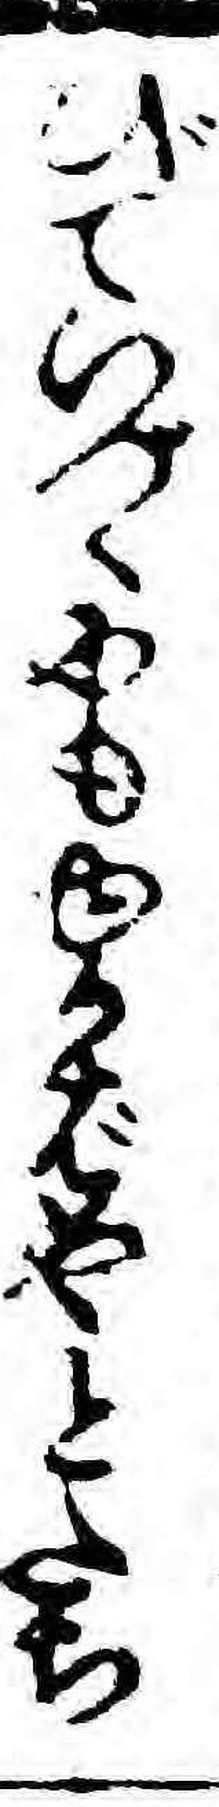びていづくにもゆかばやとたち
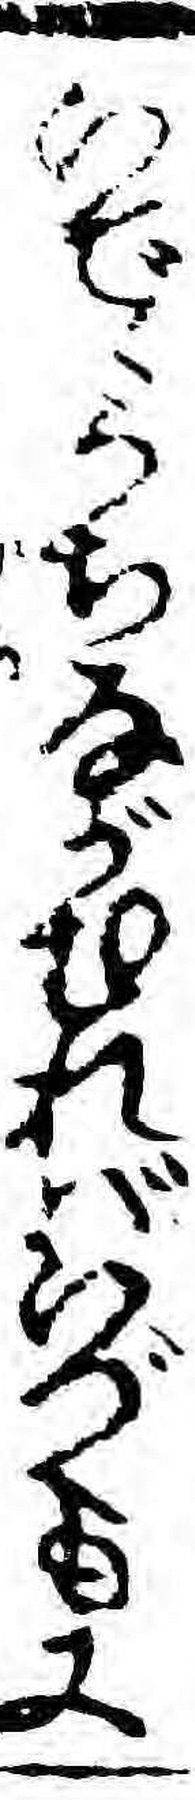いでゝうちながむればいづくも又
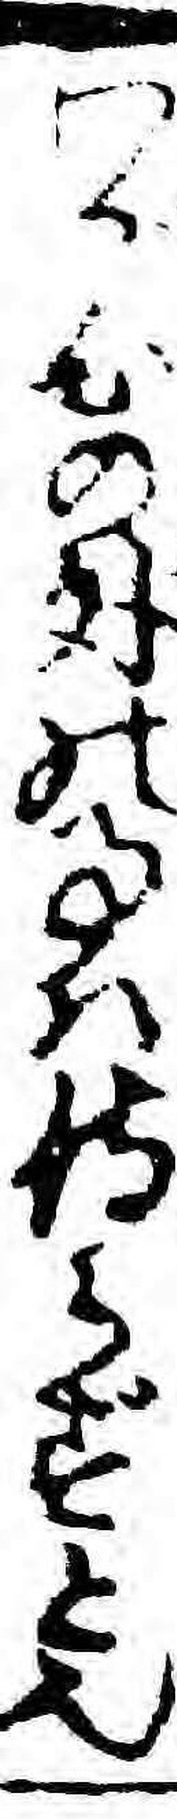わが心の外の事は侍らずと也
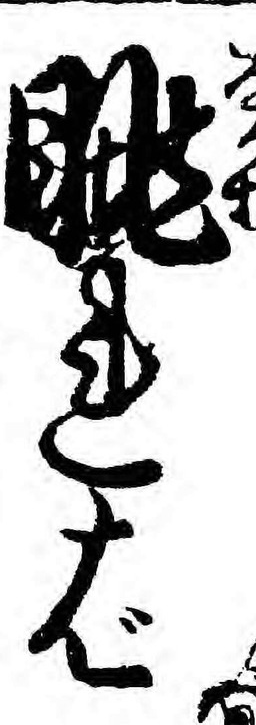眺れば
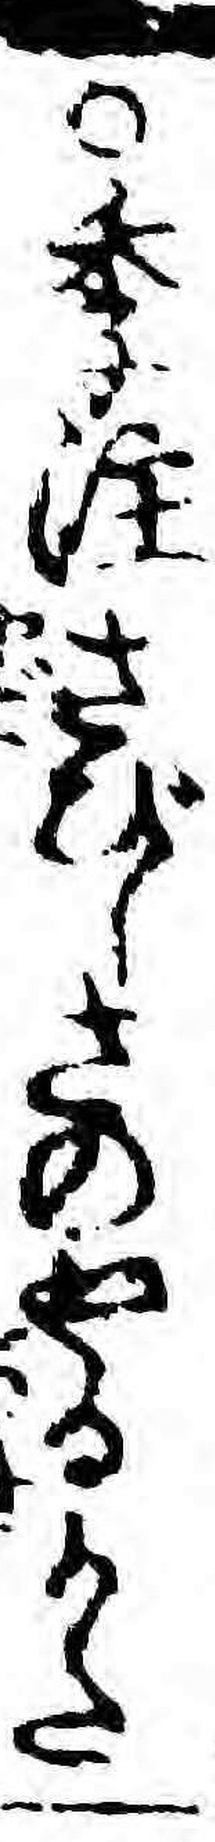〇季注さびしさのやるかた
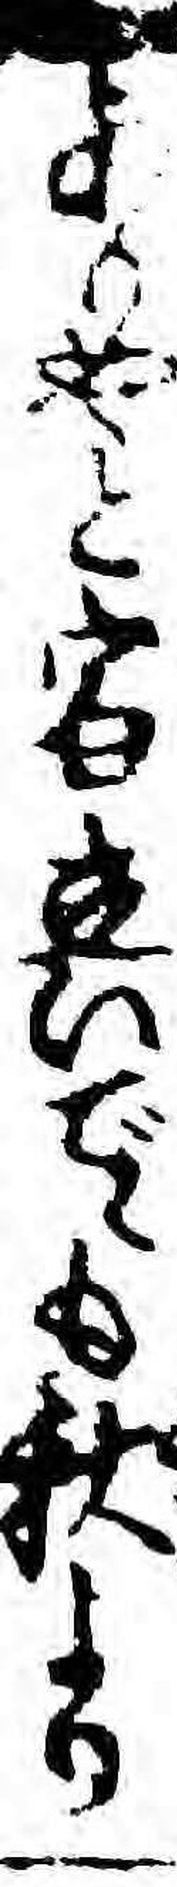ありやと宿立いでゝも秋より
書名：頭書和歌注譯／壽賀多百人一首小倉錦
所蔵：国文学研究資料館
